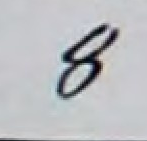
8
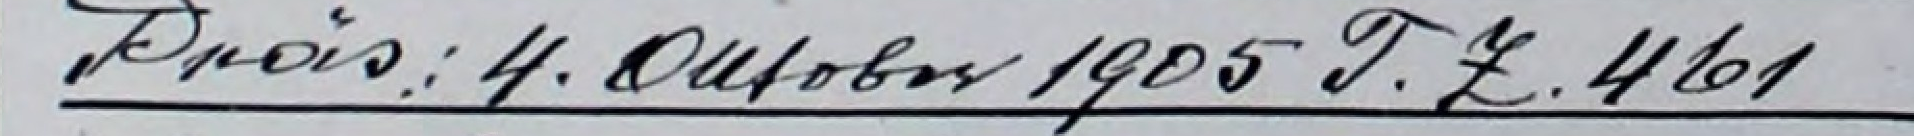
Präs: 4. Oktober 1905 T.Z. 461
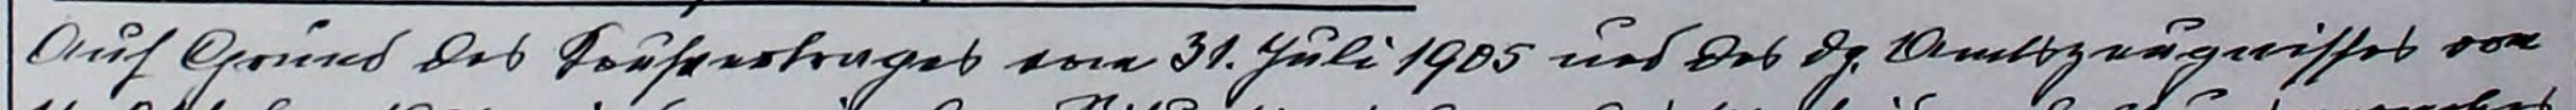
Auf Grund des Kaufvertrages vom 31. Juli 1905 und des dg. Amtszeugnisses vom
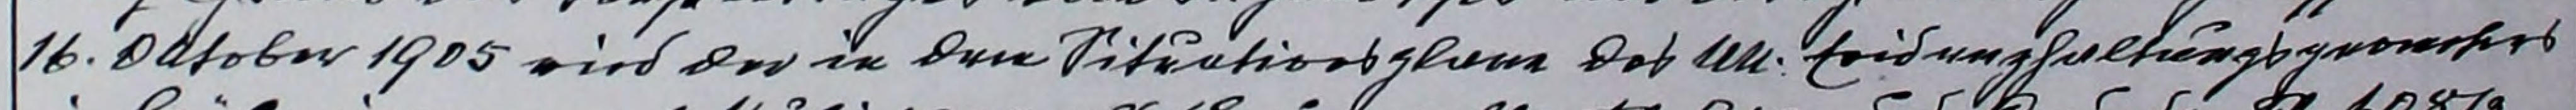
16. Oktober 1905 wird der in dem Situationsplane des Ak: Evidenzhaltungsgeometers
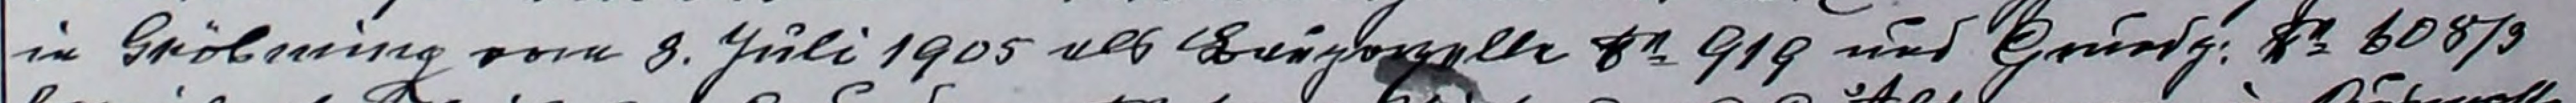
in Gröbming vom 8. Juli 1905 als Bauparzelle No 919 und Grundp: No 608/3
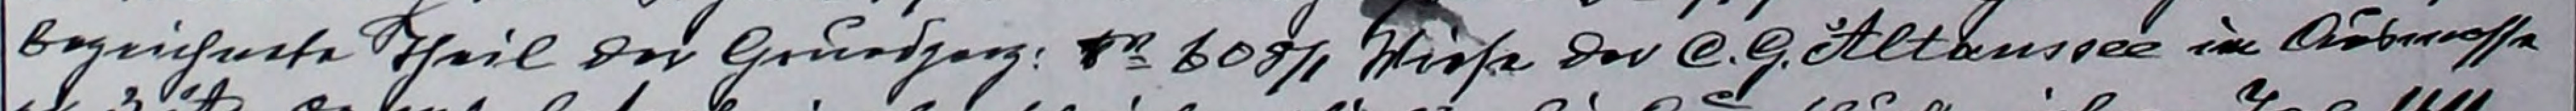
bezeichnete Theil der Grundparz: No 608/1 Wiese der C.G. Altaussee in Ausmesse
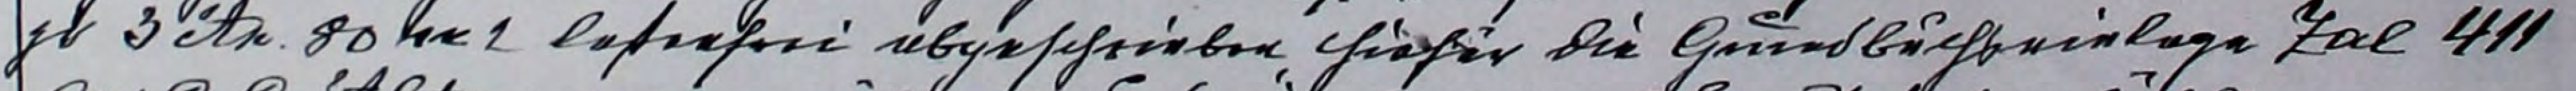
pr 3 An. 80 ??? lastenfrei abgeschrieben hiefür die Grundbuchseinlage Zal 411
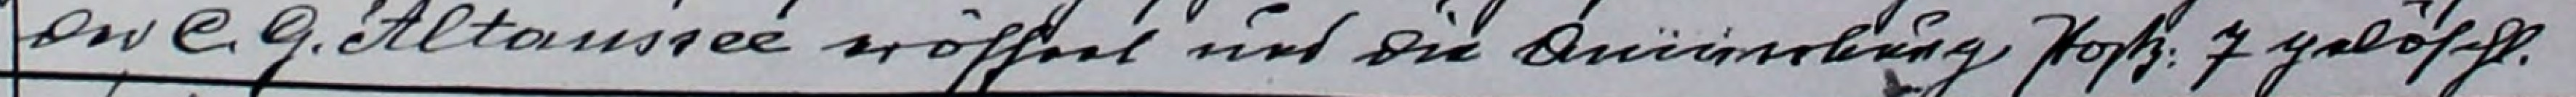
der C.G. Altaussee eröffnet und die Anmerkung Postz: 7 gelöscht.
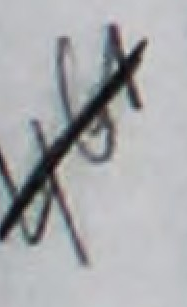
461
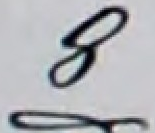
8
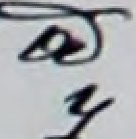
a
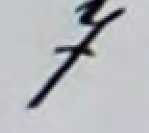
7
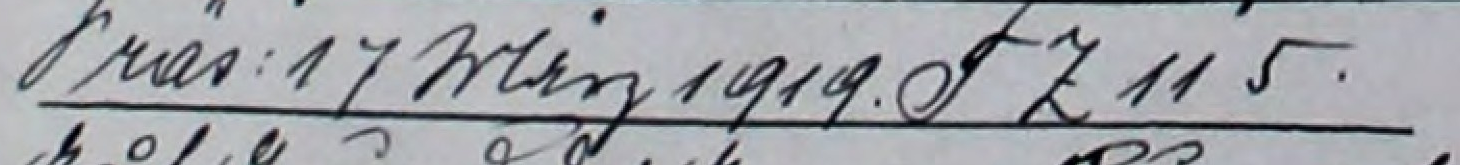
Präs: 17 März 1919. T Z 115.
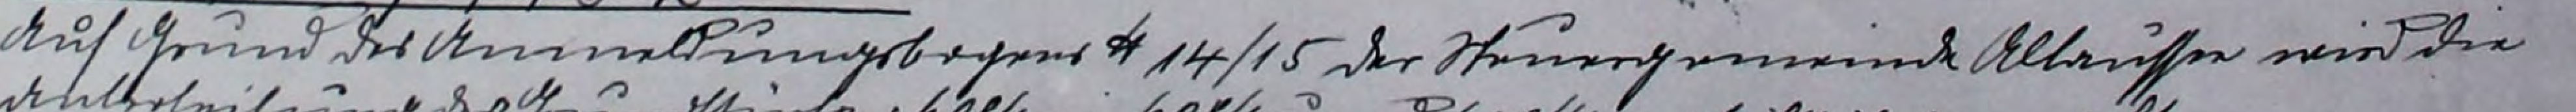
Auf Grund des Anmeldungsbogens ? 14/15 der Steuergemeinde Altaussee wird die
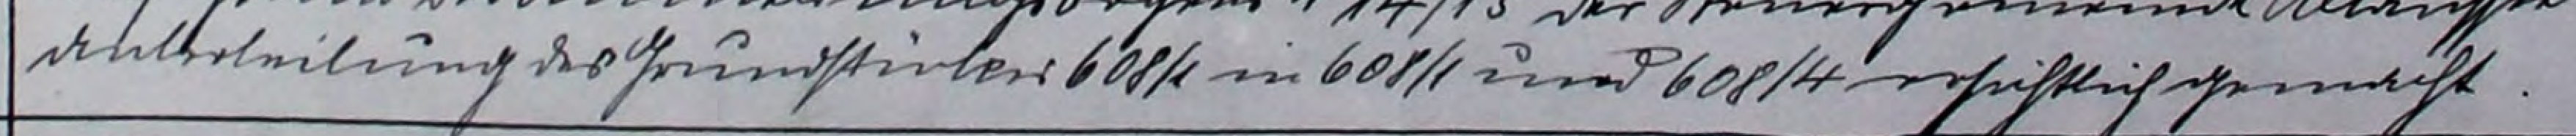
Anlenleitung des Grundstückes 608/1 in 608/1 und 608/4 ersichtlich gemacht.
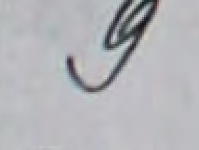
9
